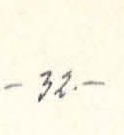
32.
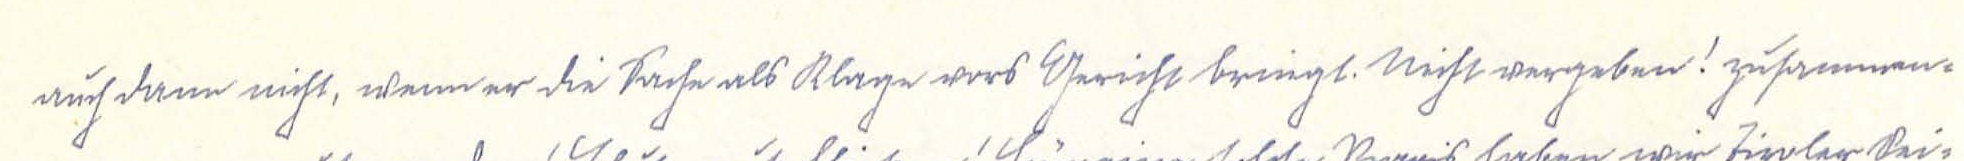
auch dann nicht, wenn er die Sache als Klage vors Gericht bringt. Nicht vergeben! zusammen-
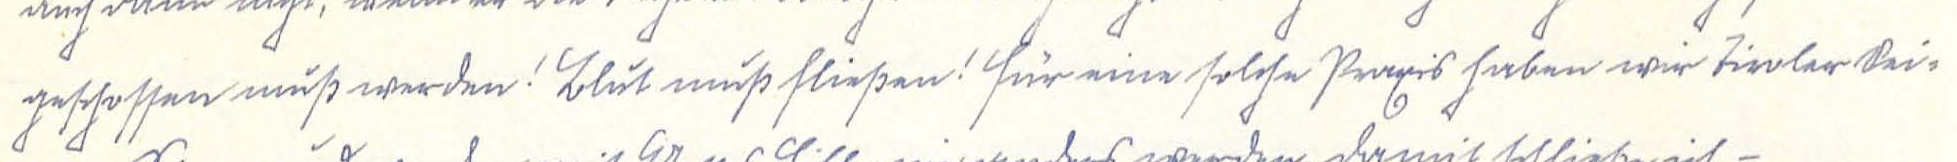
geschossen muß werden! Blut muß fließen! Für eine solche Praxis haben wir Tiroler kei-
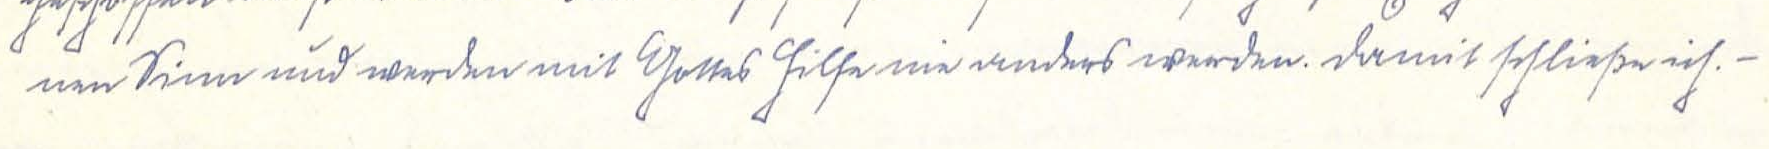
nen Sinn und werden mit Gottes Hilfe nie anders werden. Damit schließe ich.-
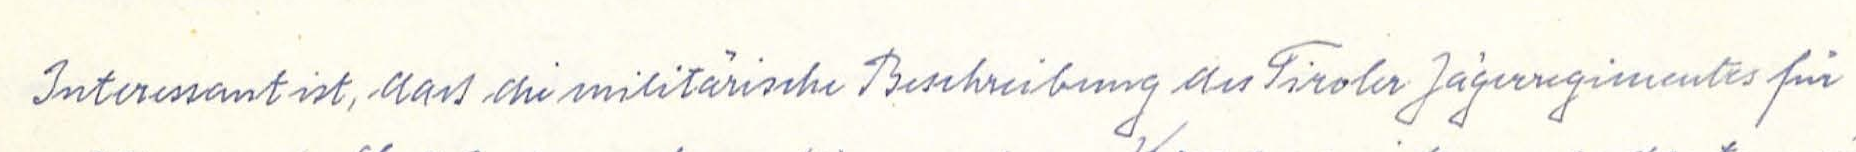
Interessant ist, daß die militarische Beschreibung des Tiroler Jägerregiments für
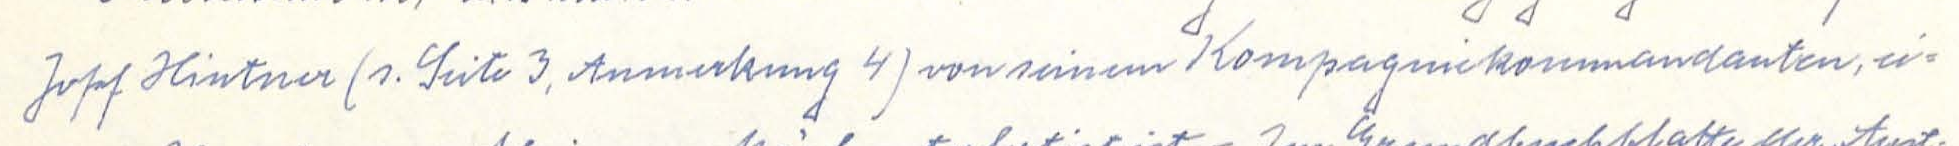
Josef Hintner (s. Seite 3, Anmerkung 4) von seinem Kompagniekommandanten, ei-
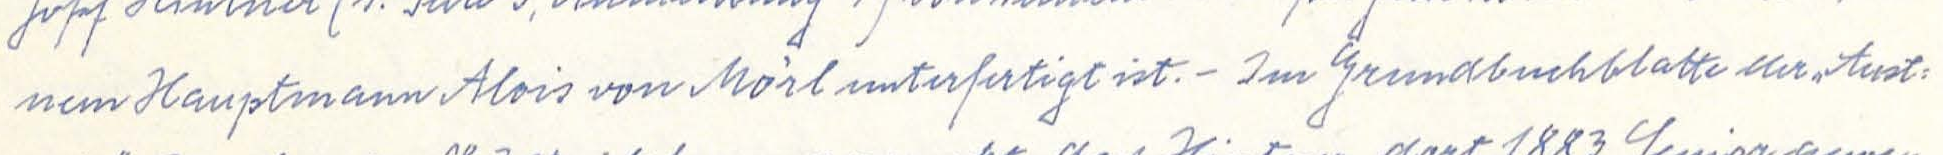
nem Hauptmann Alois von Mörl entfertigt ist.- Im Grundbuchblatte der „Aust-
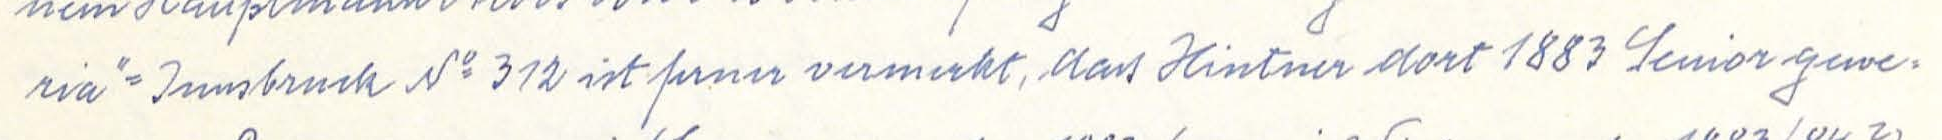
ria“ – Innsbruck Nr. 318 ist ferner vermerkt, dass Hintner dort 1883 Senior gewe-
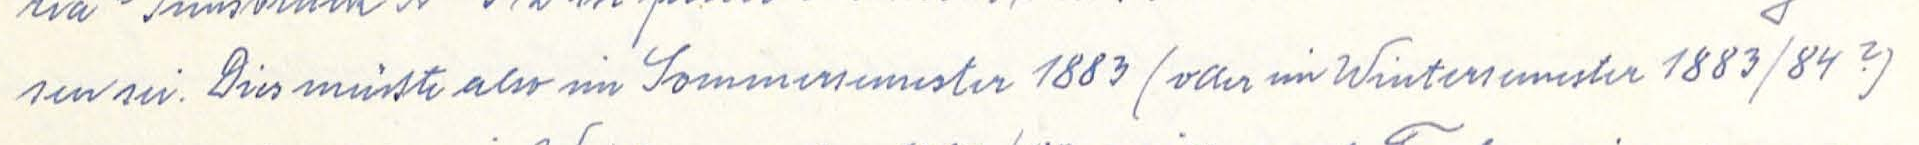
sen sei. Dies müsste aber im Sommersemester 1883 (oder im Wienterseesher 1883 /84?)
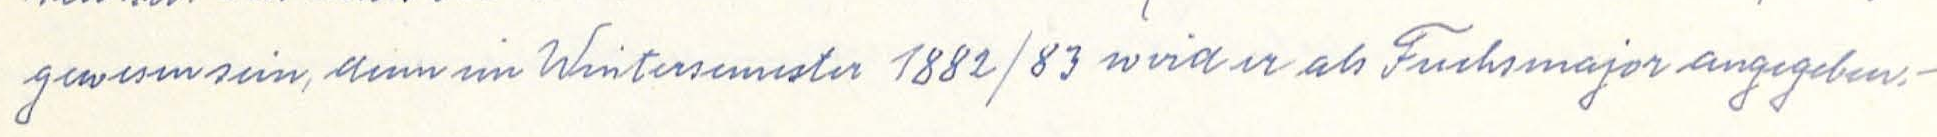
gewesen sein, denn im Wintersemester 1882/83 wird er als Fuchsmajor angegeben.-
